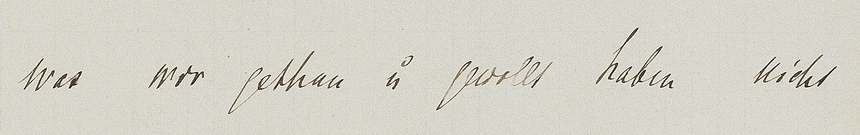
was wir gethan u gewollt haben nicht
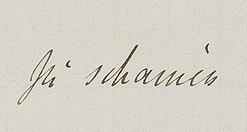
zu schämen.
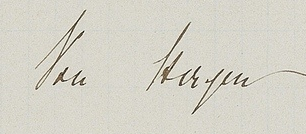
Von Herzen
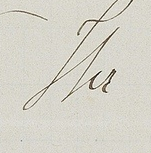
Ihr
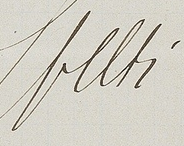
Welti
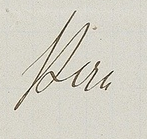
Bern
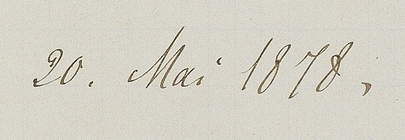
20. Mai 1878.
